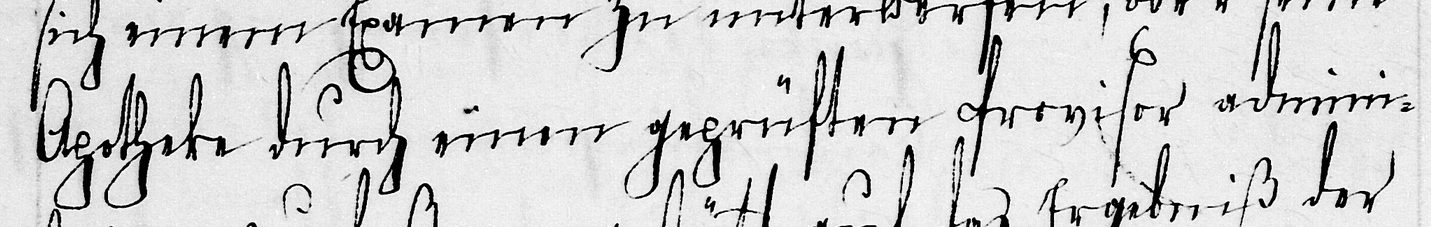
Apotheke durch einen geprüften Previsor admini¬
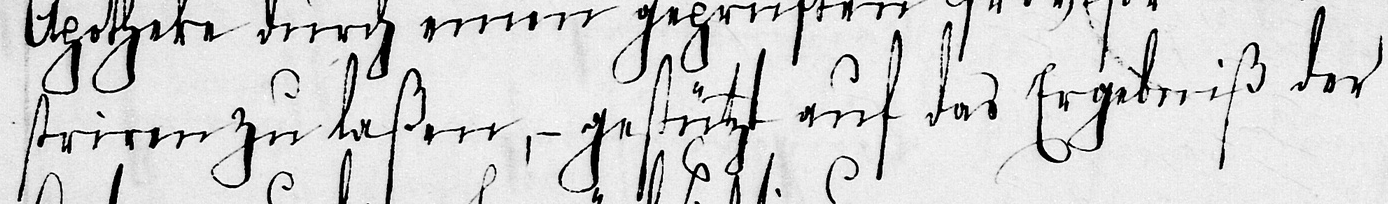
striren zu laßen, – gestützt auf das Ergebniß der
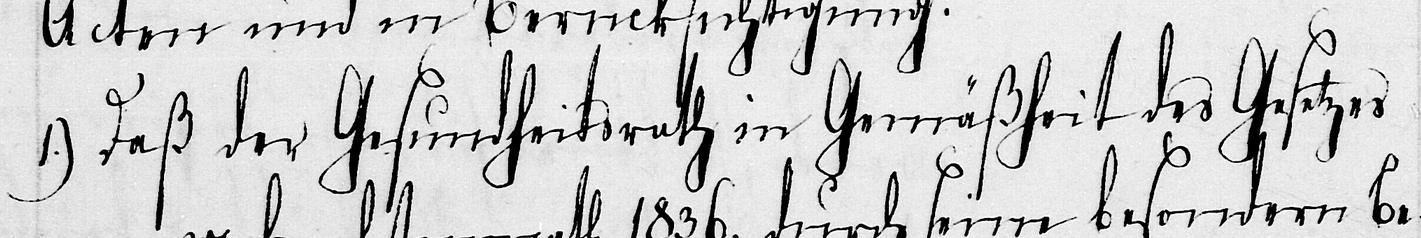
1.) Daß der Gesundheitsrath in Gemäßheit des Gesetzes
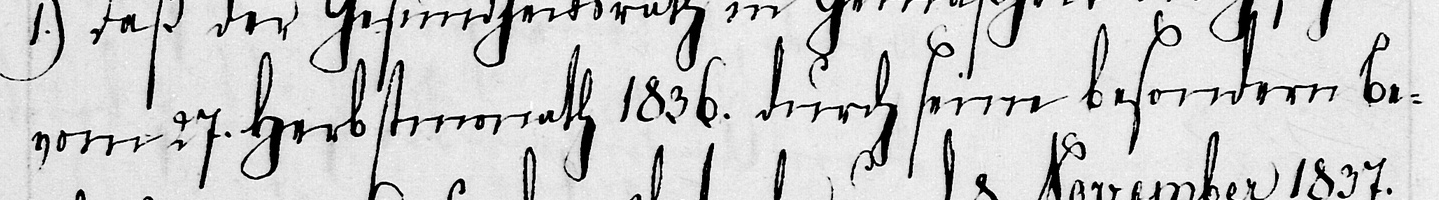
vom 27. Herbstmonath 1836. durch seine besondern Be¬
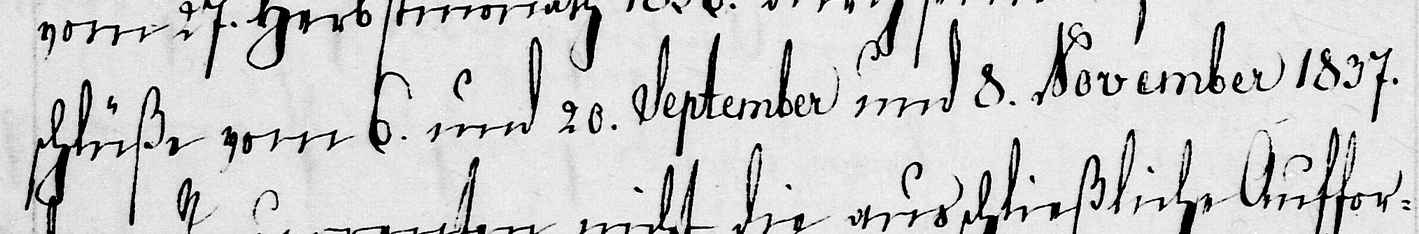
schlüße vom 6. und 20. September und 8. November 1837.
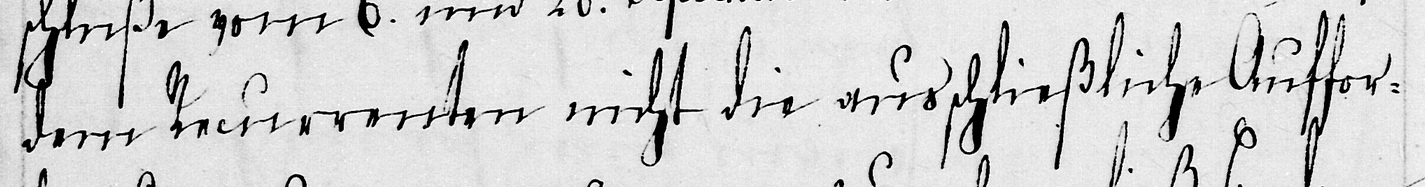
dem Recurrenten nicht die ausschließliche Auffor¬
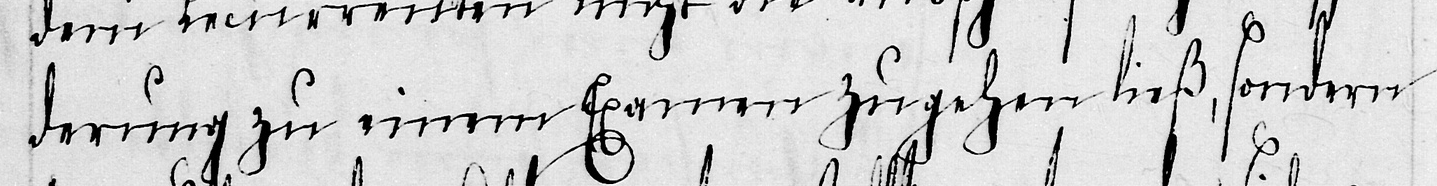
derung zu einem Examen zugehen ließ, sondern
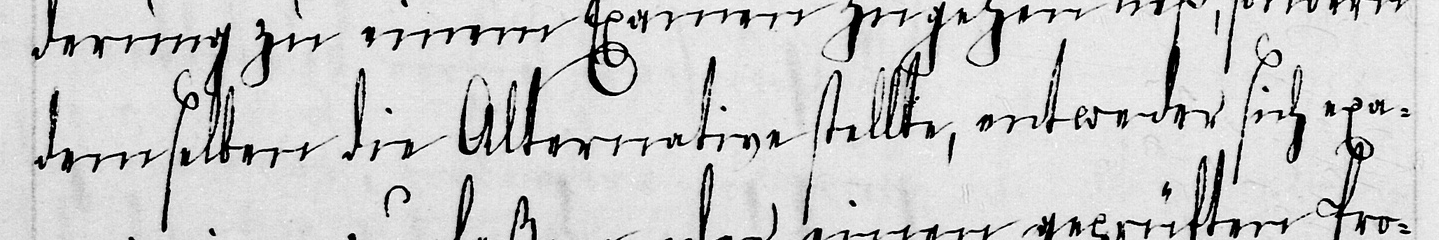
demselben die Alternative stellte, entweder sich ex¬
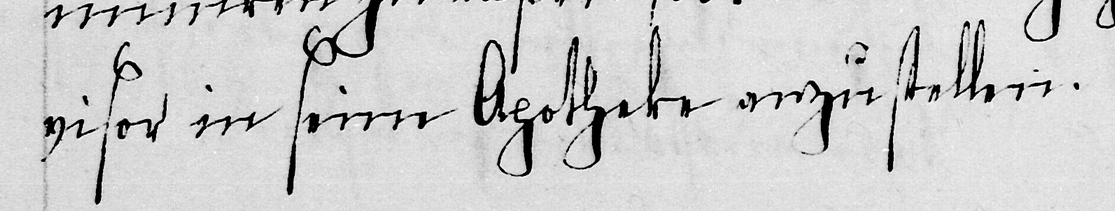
visor in seine Apotheke anzustellen.
